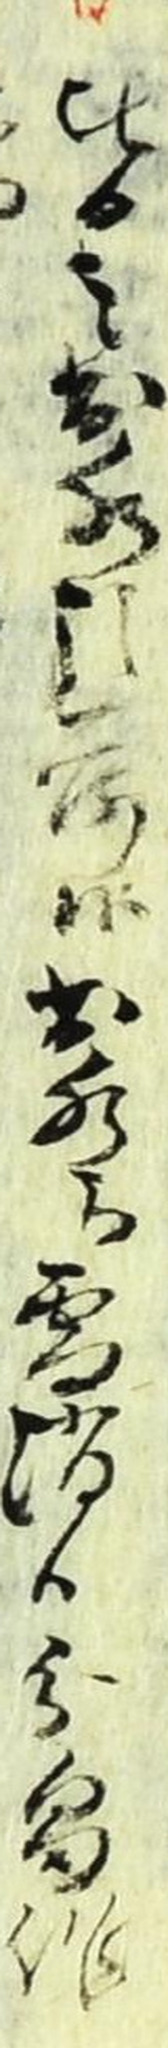頃日之出水引落候出水ニ而雪消候分畠作
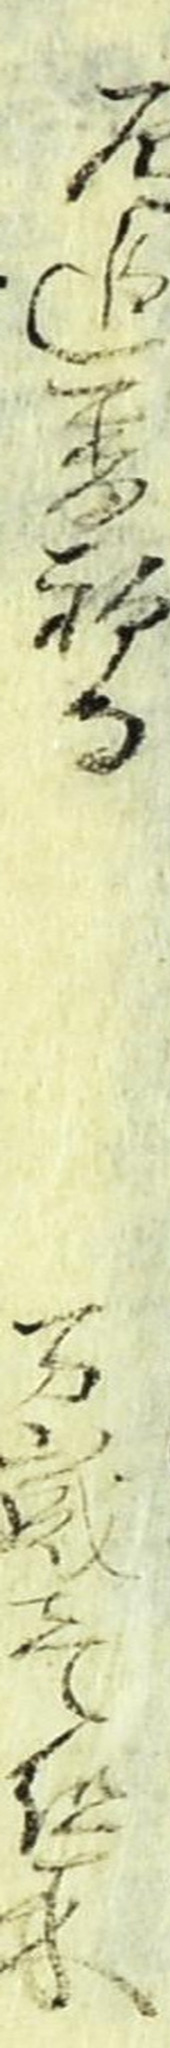雁追番初る万歳壱組来
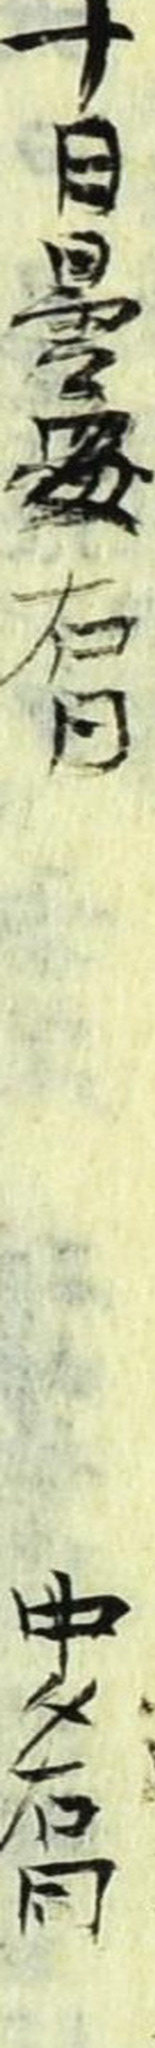十日曇右同中夕右同
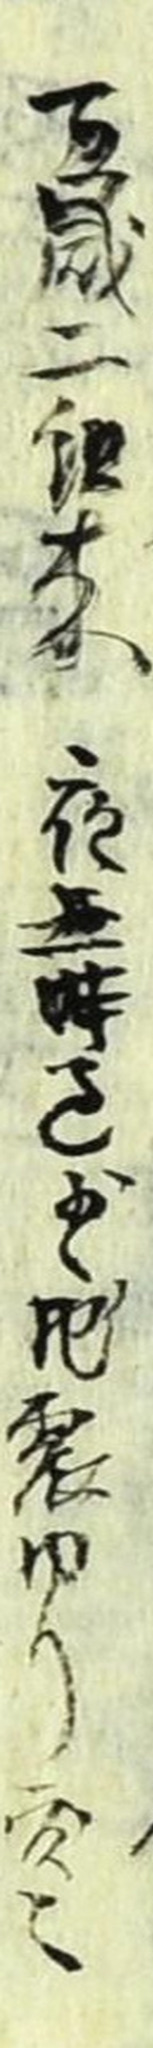万歳二組来夜五時過少々地震ゆり度々
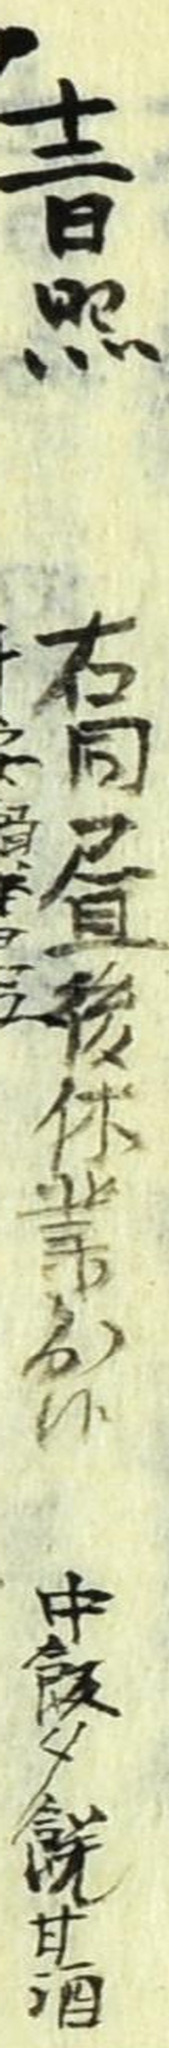○十二日照右同昼後休業致候中飯夕餅甘酒
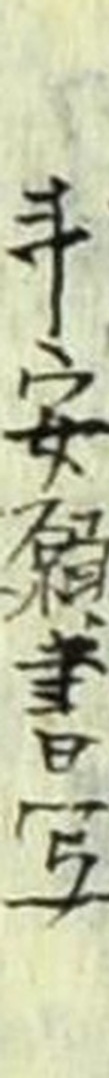平安願書写
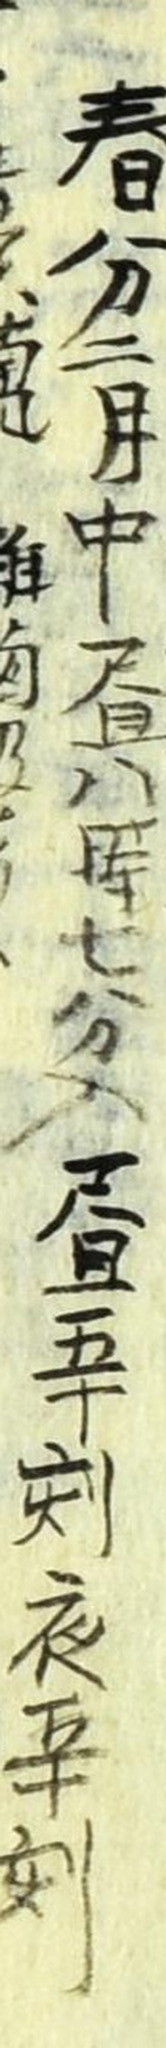春分二月中昼八時七分入昼五十刻夜五十刻
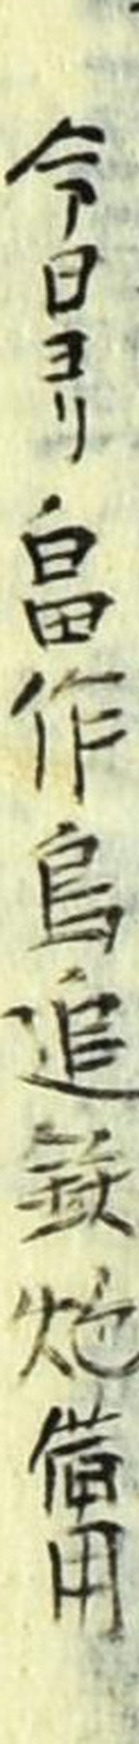今日ヨリ畠作鳥追鉄炮備用

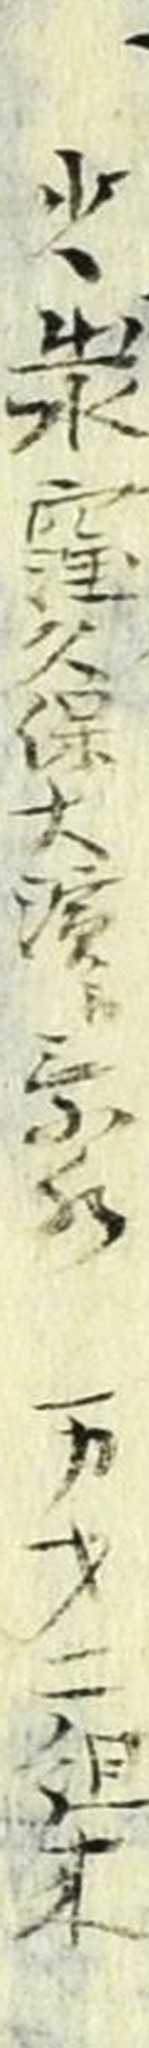少々出水窪久保大浜江乗水万才二組来
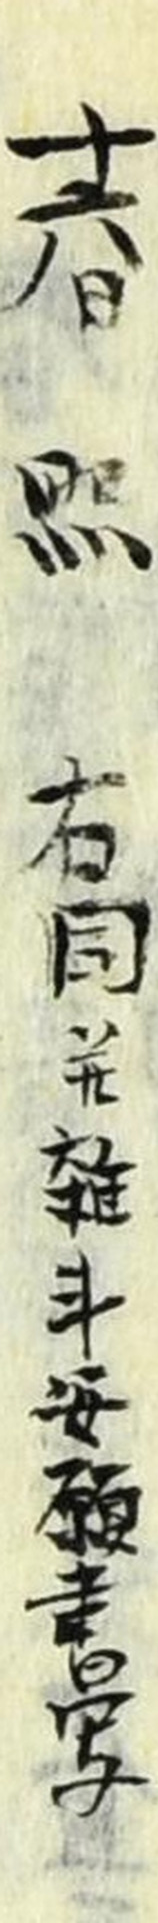十六日照右同并雑計安願書写
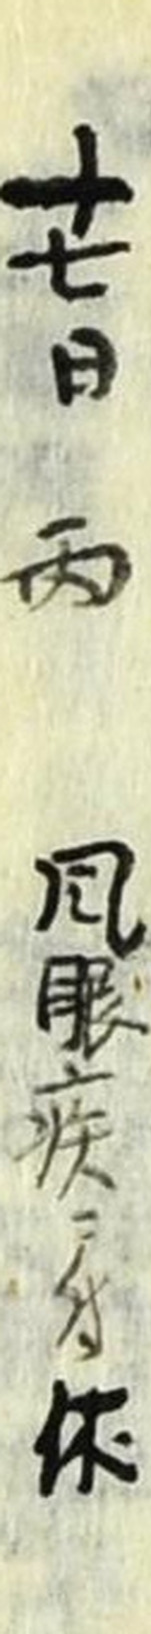十七日雨風眼疾ニ付休
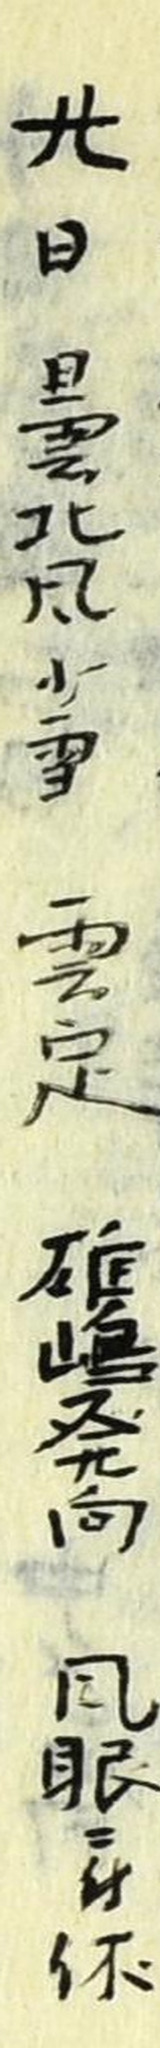廿日曇北風少雪雲定雄島発向風眼ニ付休
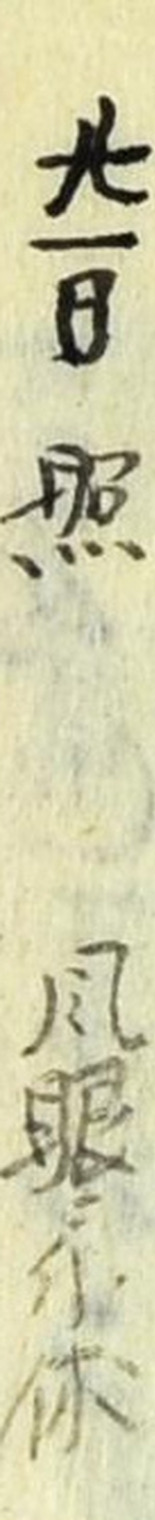廿一日照風眼ニ付休
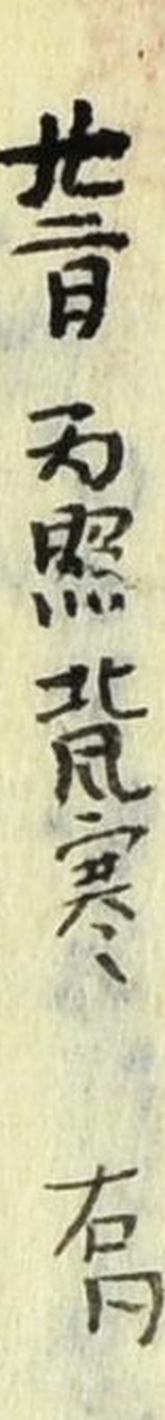廿二日雨照北風寒右同
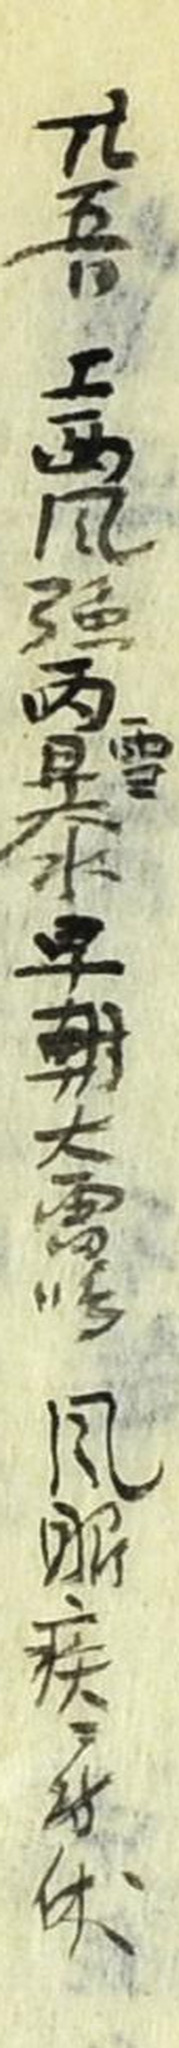廿五日上西風強雨雪暴早朝大雷鳴風眼疾ニ付休
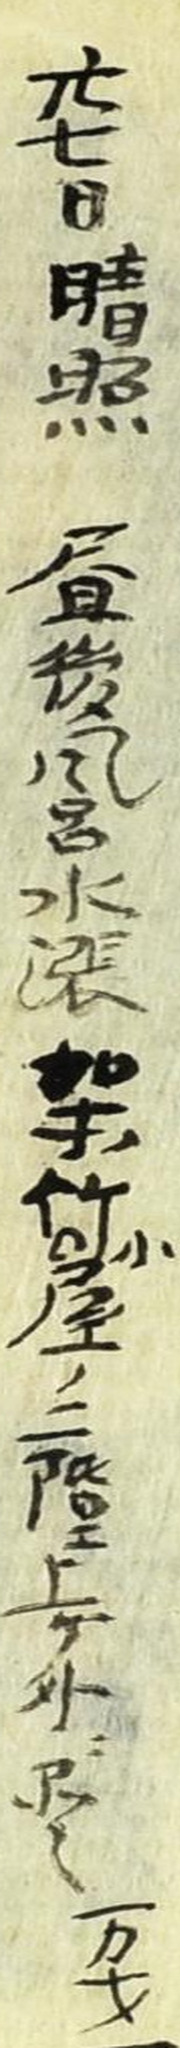廿七日晴照昼後風呂水漲架竹小屋ノ二階エ上ケ外ニ品々万才一
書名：（日記）
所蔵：福井県文書館 Fukui Prefectural Archives
